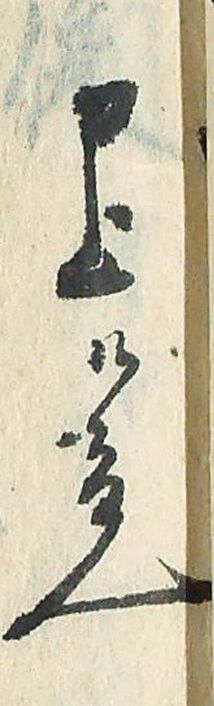申上る覚
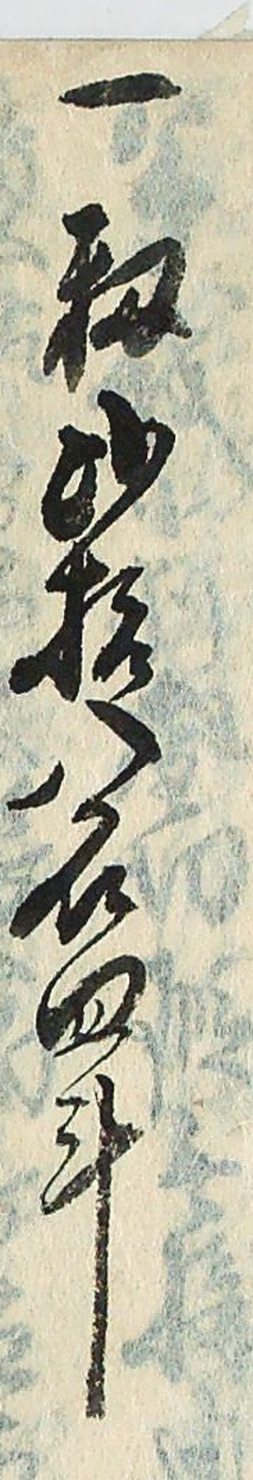一籾弐拾八石四斗
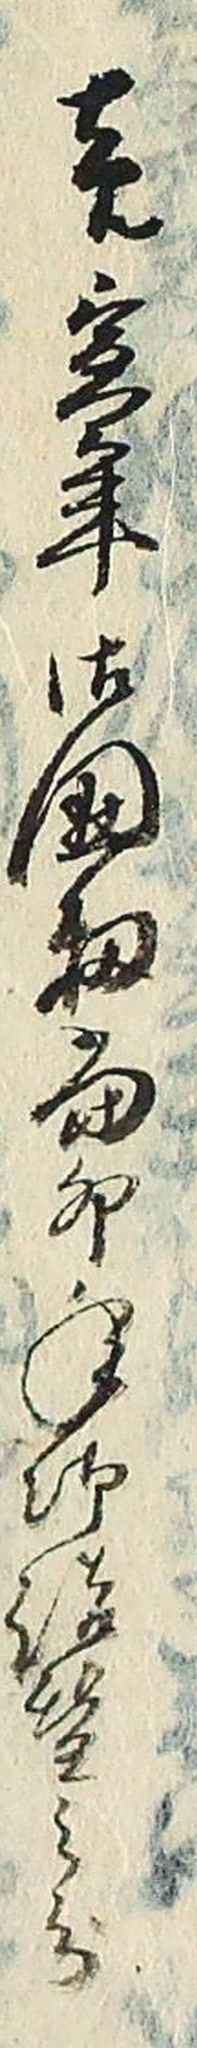去る寅年御囲籾当卯年御詰替之分
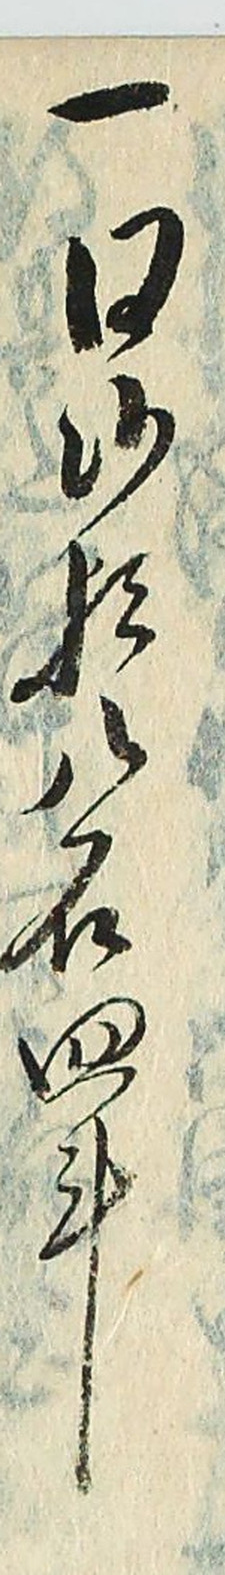一同弐拾八石四斗
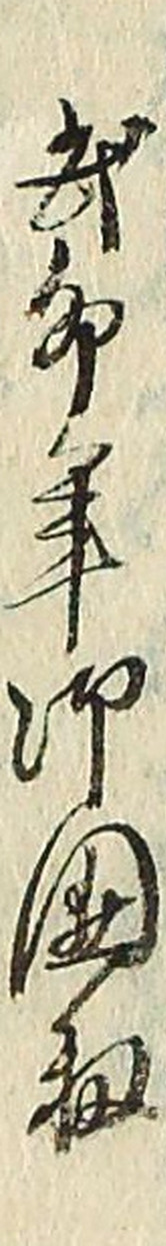当卯年御囲籾
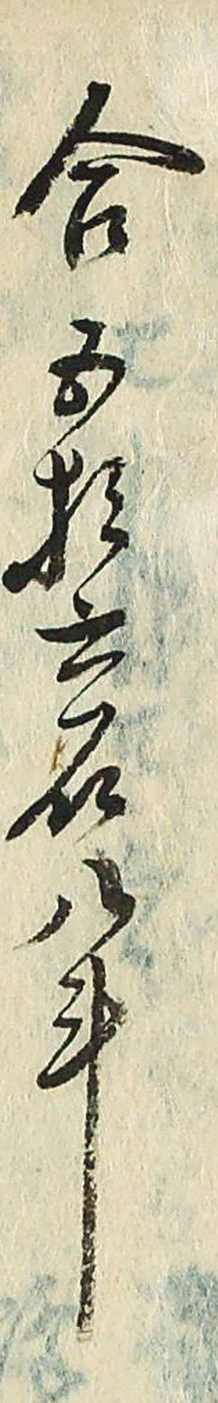合五拾六石八斗
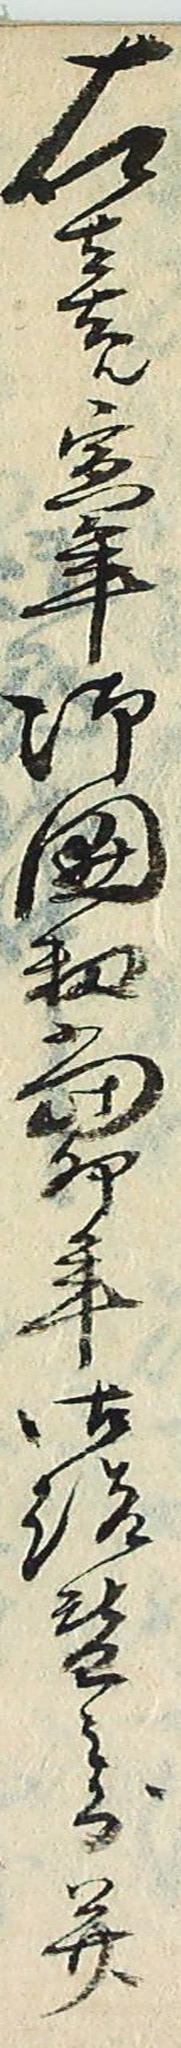右者去る寅年御囲籾当卯年御詰替之分幷
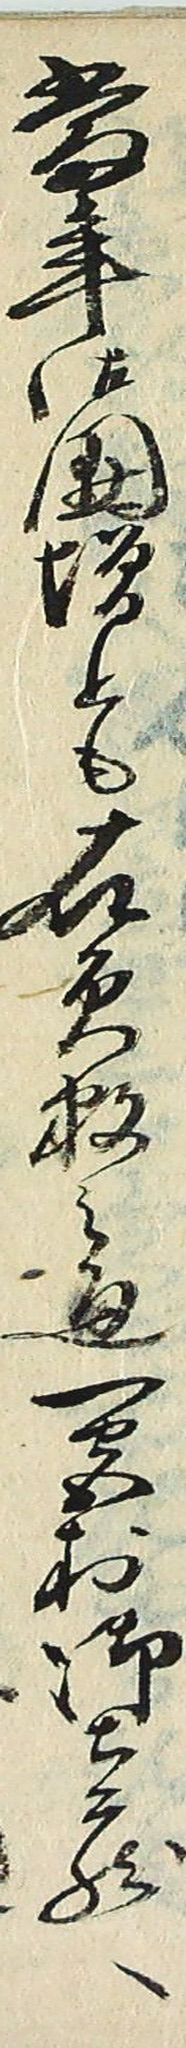当年御囲増とも右員数之通一宮村御土蔵へ
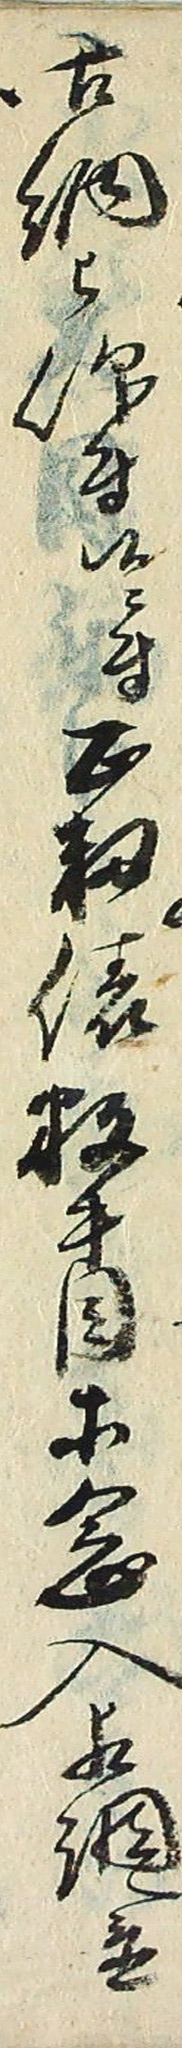御納被仰付候に付正籾俵数目等念入相調へ置
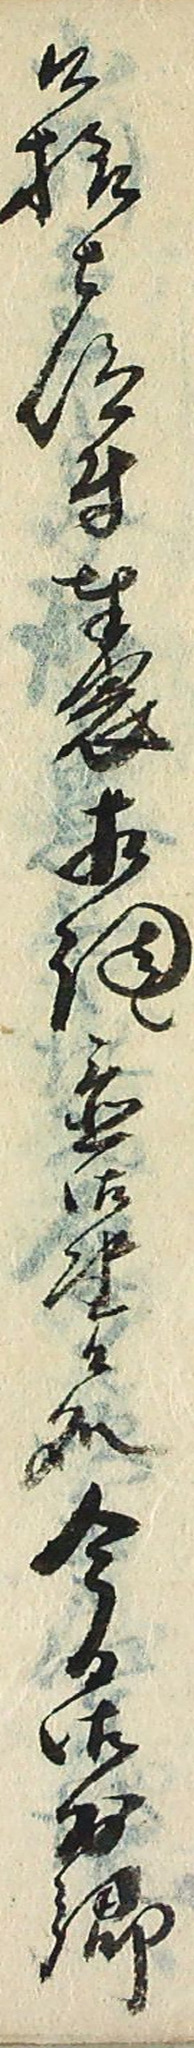候様被仰付奉畏相調へ置御坐候処今日御出郷
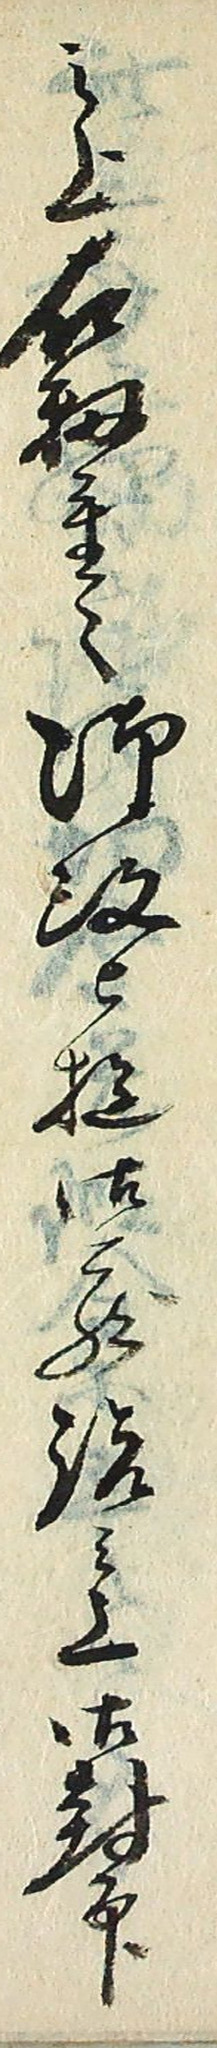之上右籾重々御改被遊御蔵詰之上御封印
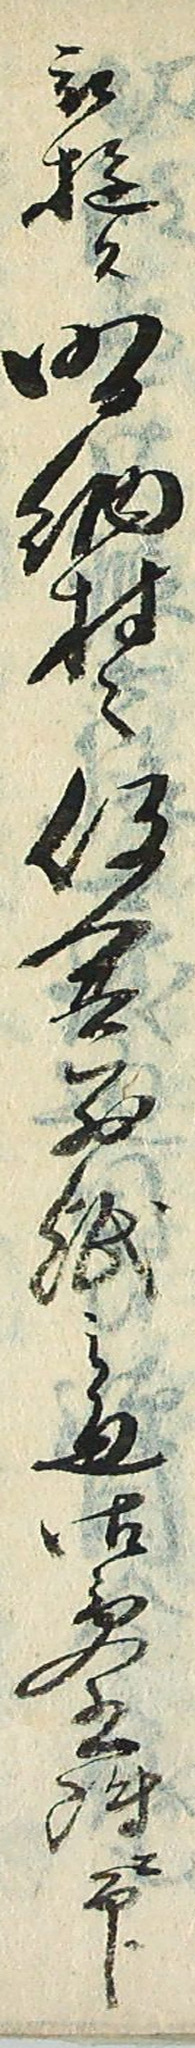被遊候仍て納村々役人共別紙之通御受書附に印
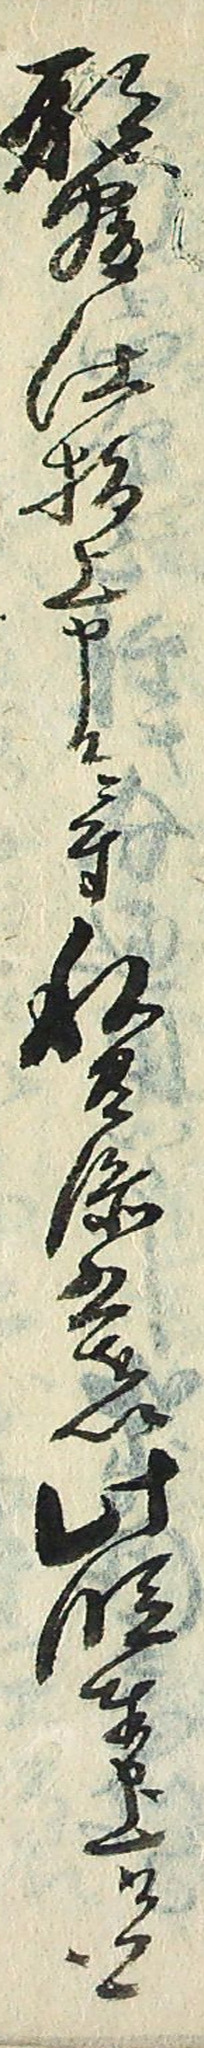形為仕指上申候に付私共添書を以此段奉申上候以上
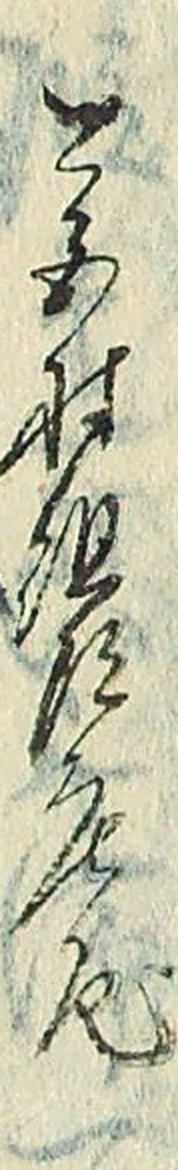一宮村組頭庄屋
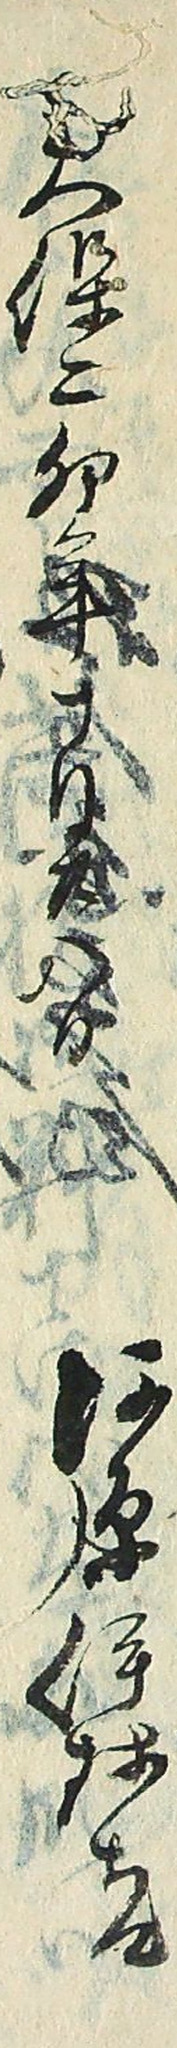天保二卯年十月廿八日河原伊勢吉
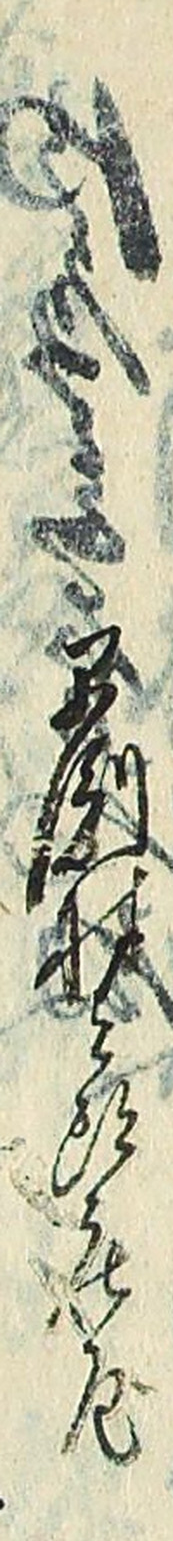早渕村与頭庄屋
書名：諸御用御□受書控
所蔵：鳴門教育大学 Naruto University of Education
